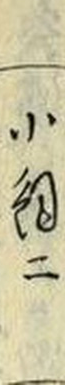小鯛二
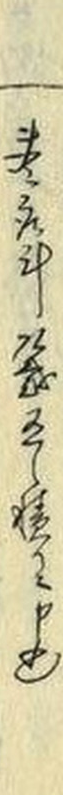夫々取計頂戴有之積りニ申込
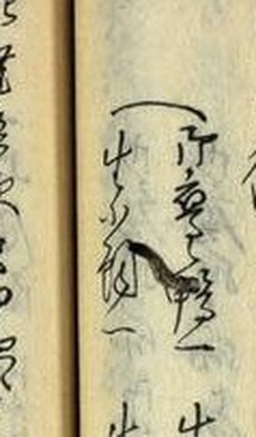生小鯛一
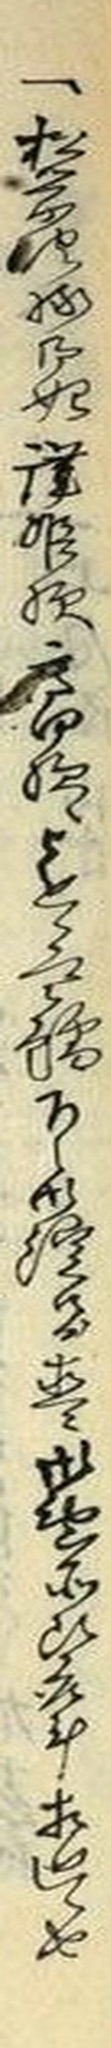一松栄院様御始謹姫様高田様へ被進候寒鱈下之御錠口ゟ直ニ御台所頭取計相廻候由
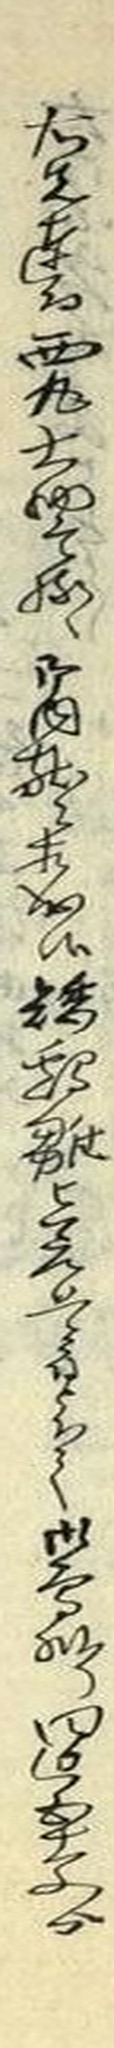右先達而西丸大納言様へ御内献ニ相成候矮鶏雛被差上候ニ付被下之御鳥掛り田辺五太夫ゟ
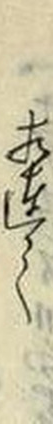相達之
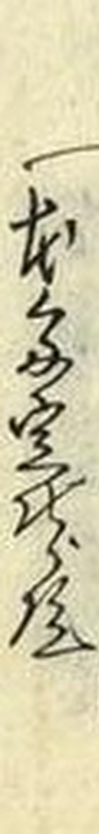本多定次郎殿
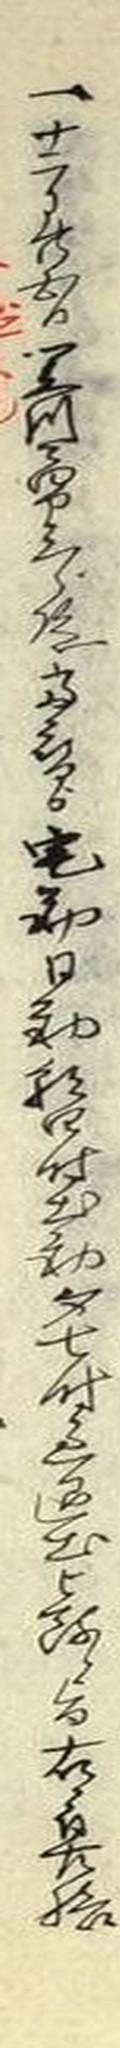一十二月廿五日関川勇三郎殿当暮ゟ宅勤日勤朝四時出勤夕七時過退出被致候旨右ニ付左膳
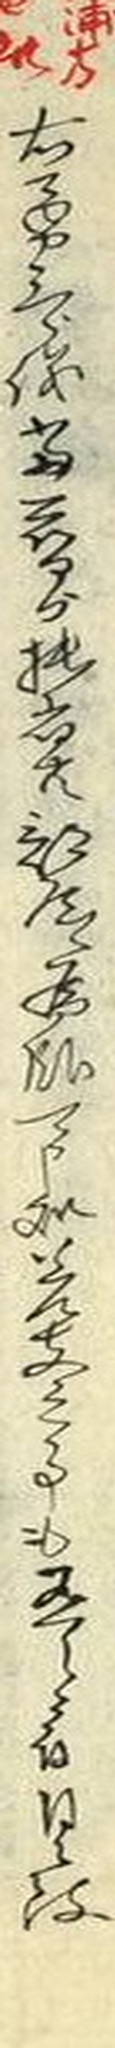右勇三郎儀当暮ゟ拙者共部屋へ為臥可申処差支之事も有之候ニ付日々致
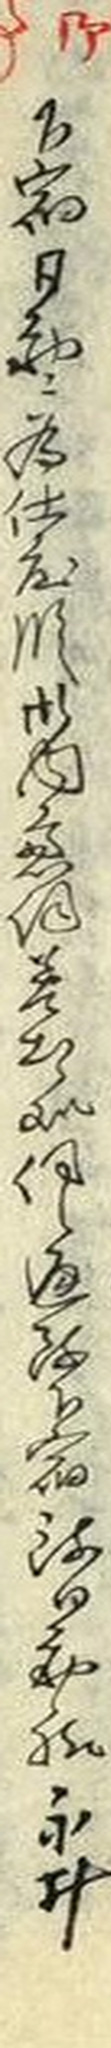下宿日勤ニ為仕度段御内慮伺差出候処伺之通致下宿致日勤候様永井
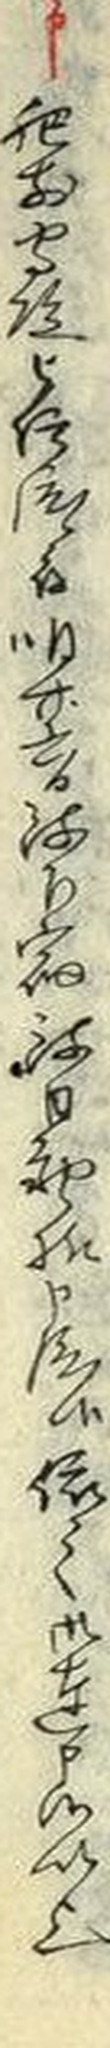肥前守殿被仰渡候ニ付明廿六日致下宿致日勤候様申渡候依之御達申候以上
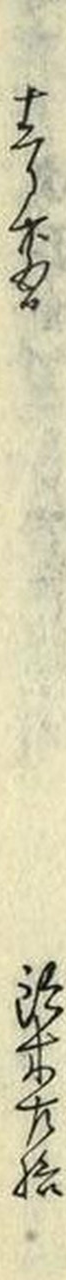十二月廿五日鈴木左膳
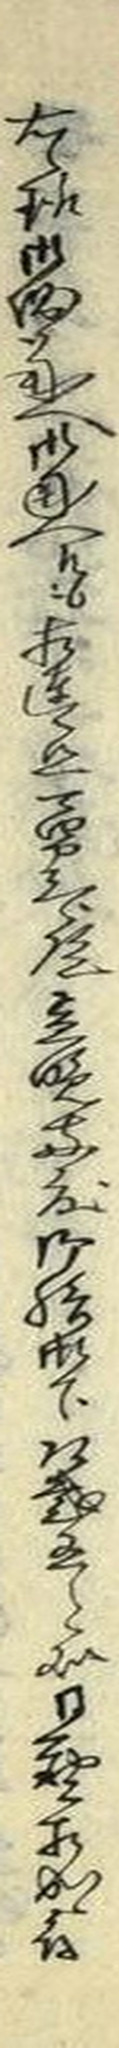右之趣御側御用人御用人江も相達之上勇三郎殿昼晩両度御膳御下頂戴有之候処日勤ニ相成候ニ付
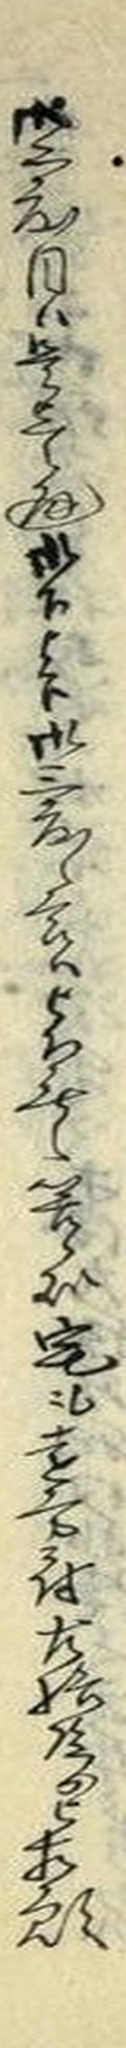御二度目ハ是迄之通御下被下御三度之節ハ被下無之筈之処宅も遠方ニ付左膳殿ゟ被相願

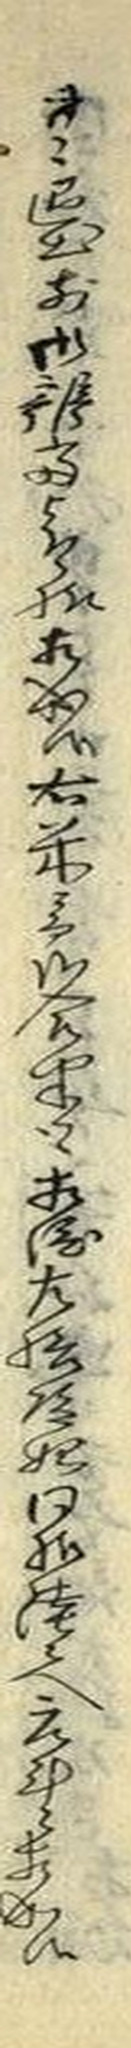退出前御弁当被下候様相成候右米ニ而弐合半ツヽ相渡左膳殿始同様陸尺取計ニ相成候
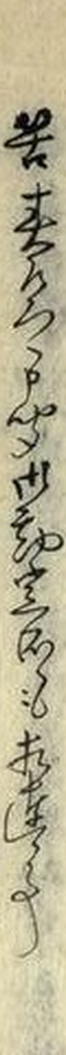筈春左衛門へ申聞御勘定所へも相達候事
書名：少傅日録抄（斉善付側向頭取日記、在府）
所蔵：福井県文書館 Fukui Prefectural Archives
